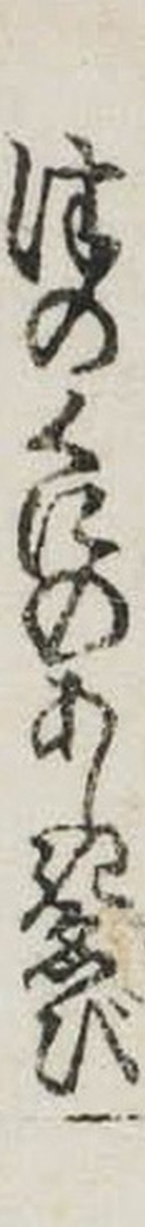つのくにのあしきゑび
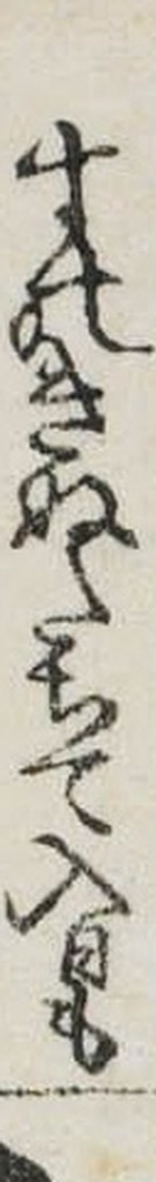すのきぬたちて入日も
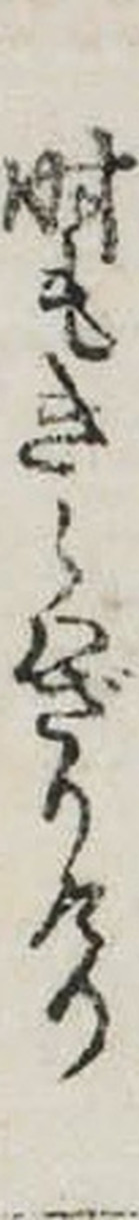時もきらはざりけり
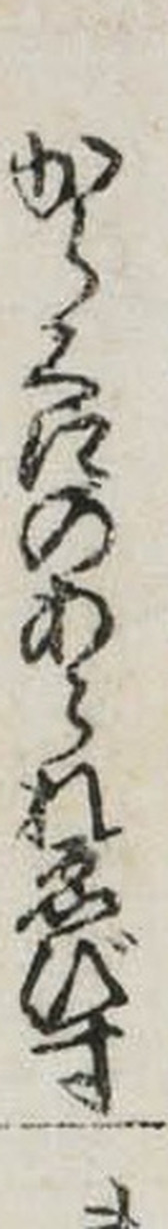からくにのあられゑびす
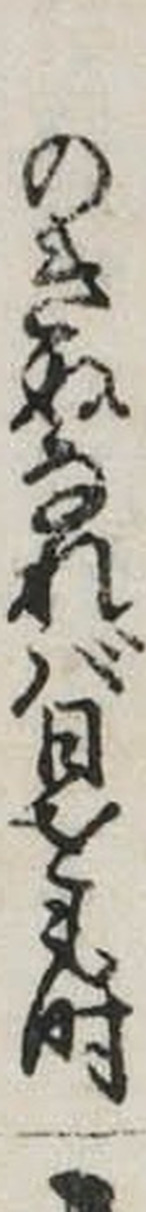のきぬなれば日をも時
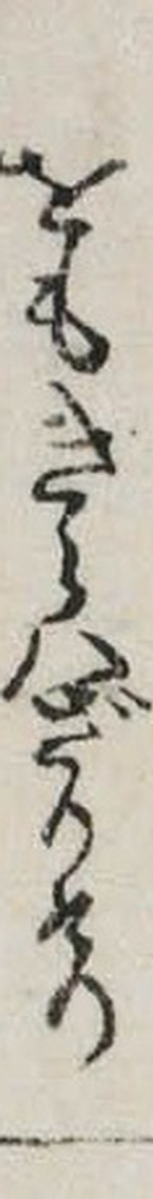をもきらはざりけり
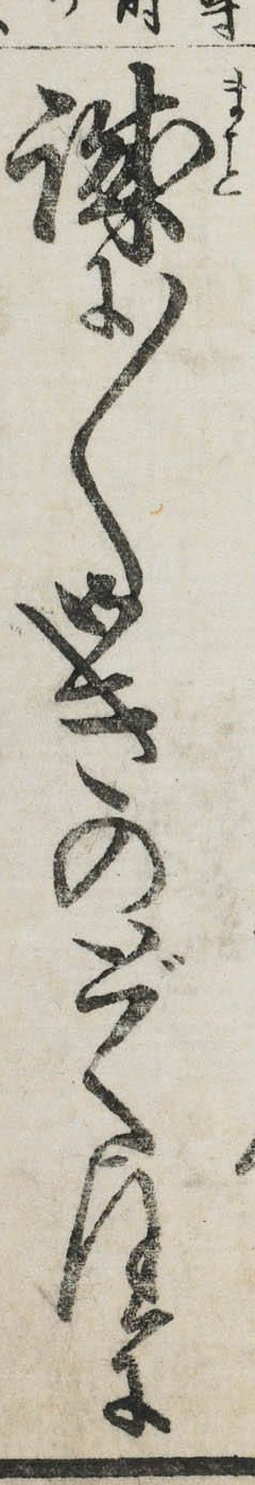誠に〳〵きのどくさまに
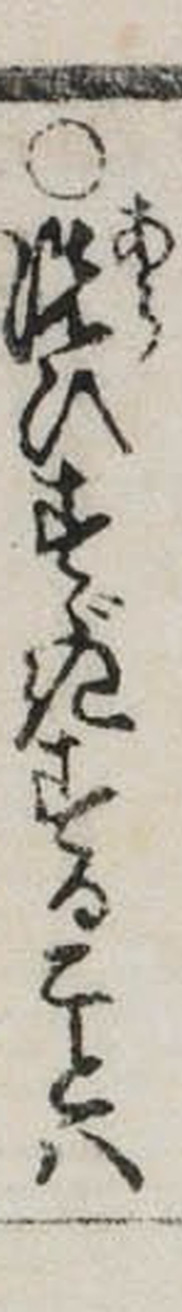○洗ひすゞきすることは
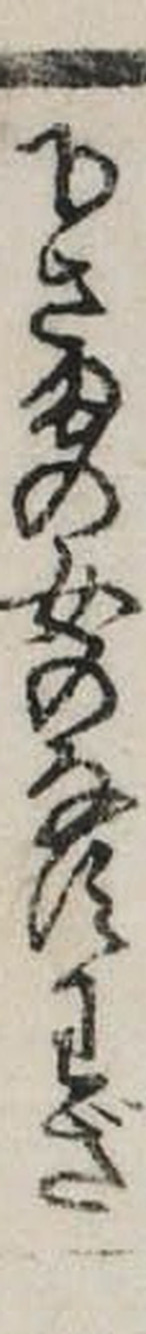下さまの女なすわざ
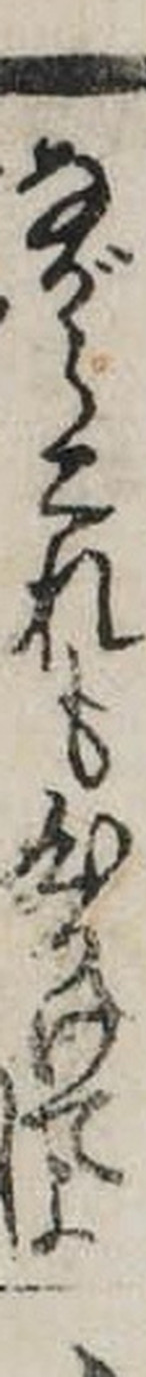ながらこれも心かけてよし
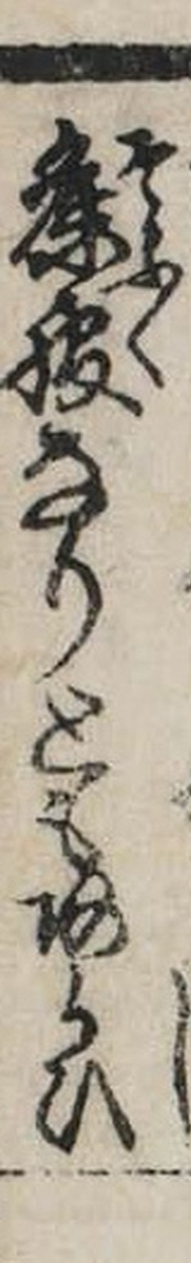麁服なりともあらひ

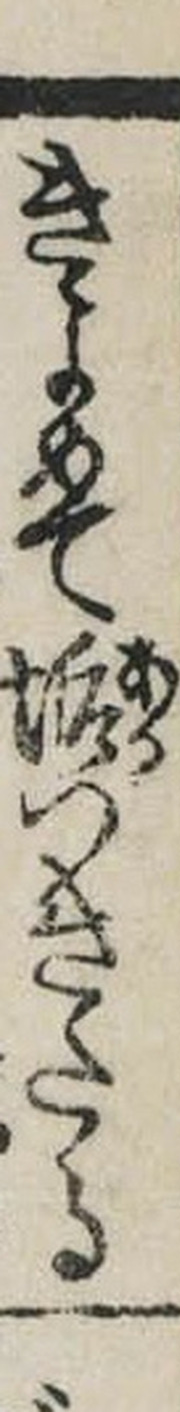きよめて垢つきたる
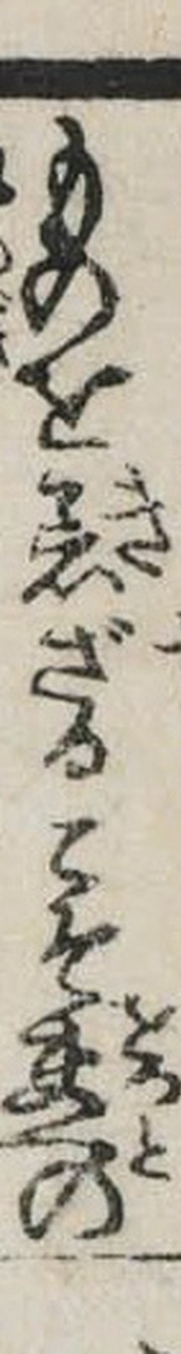ものを着ざるこそ夫の
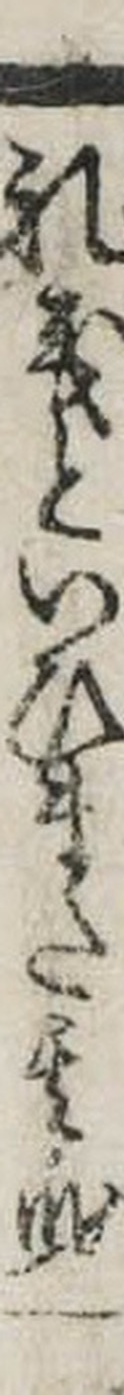礼義といひまた其身
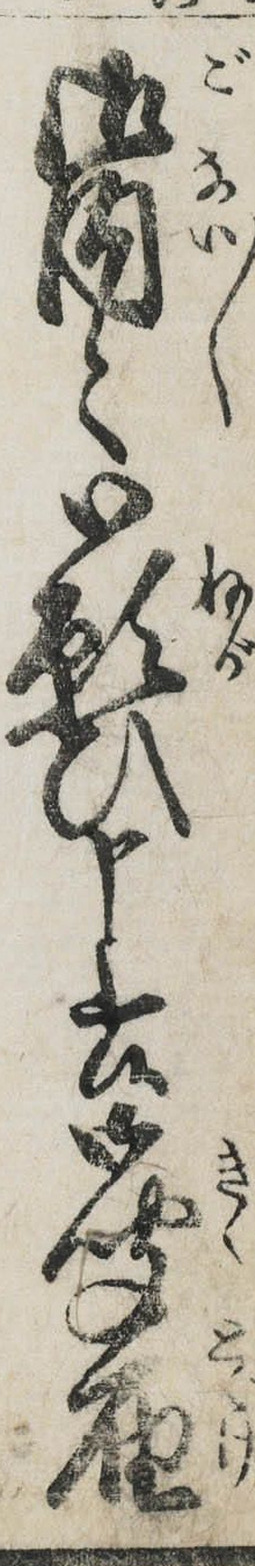御内々御願ひ申上候御聞届
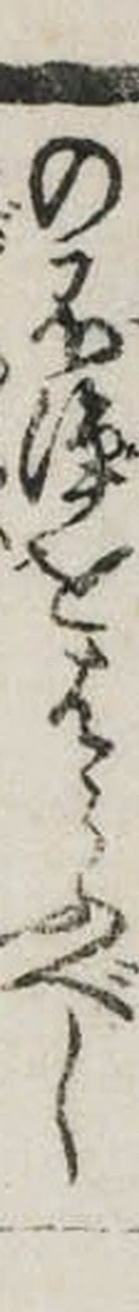の不浄をはらふべし
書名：頭書萬用婦人手紙之文言
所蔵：東京学芸大学教育コンテンツアーカイブ
